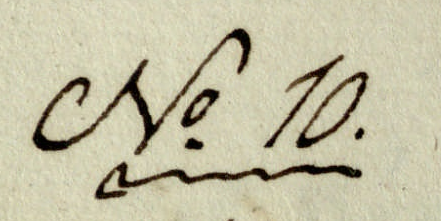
No 10.
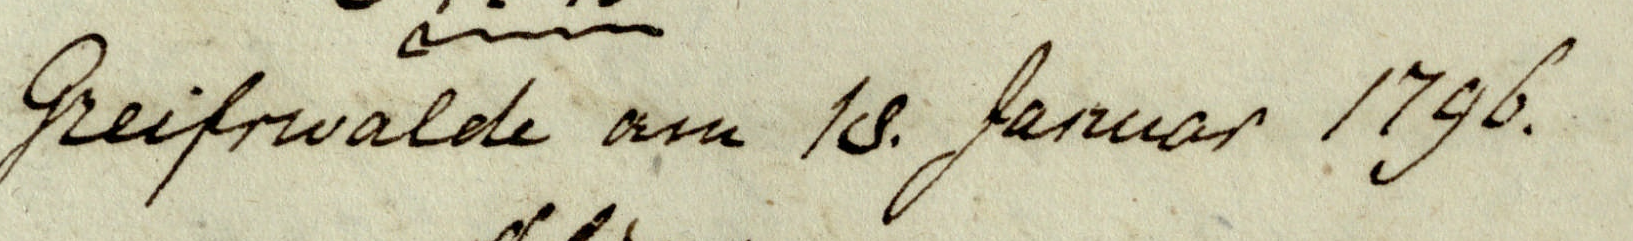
Greifswalde am 18. Januar 1796.
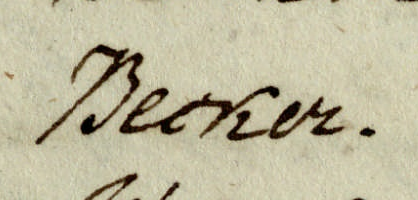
Becker.
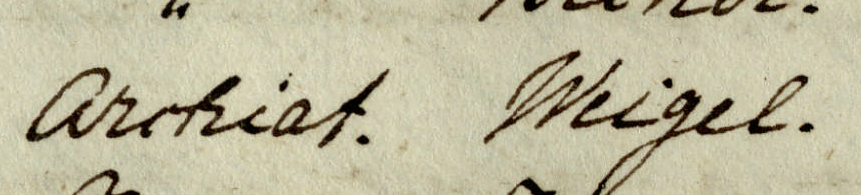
Archiat. Weigel.
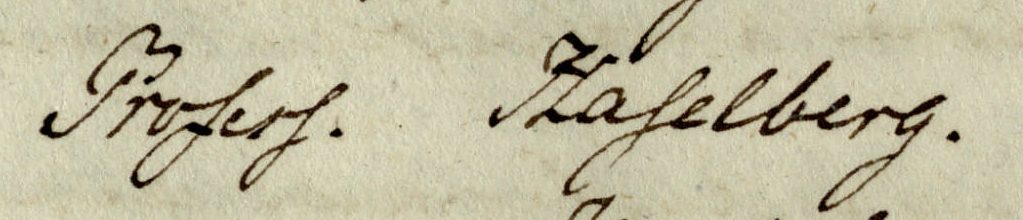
Profess. Haselberg.
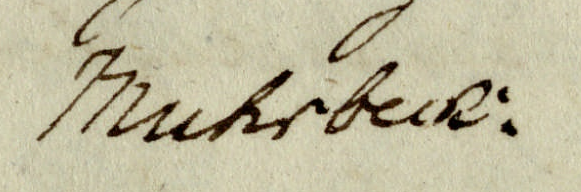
Muhrbeck.
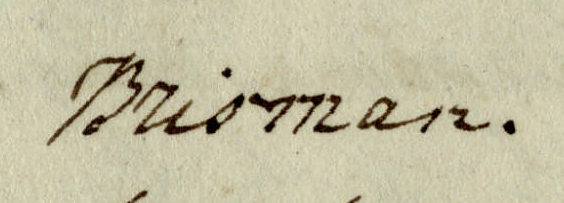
Brisman.
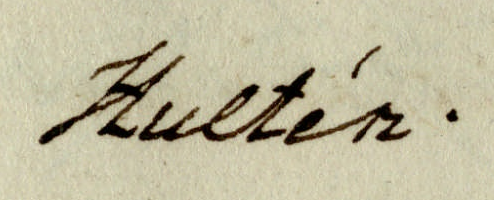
Hultén.
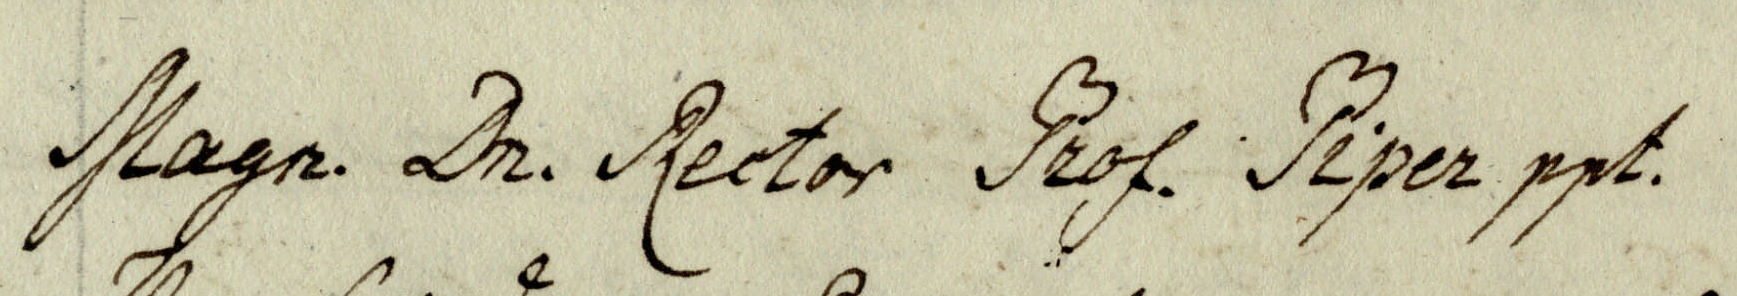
Magn. Dn. Rector Prof. Piper ppt.
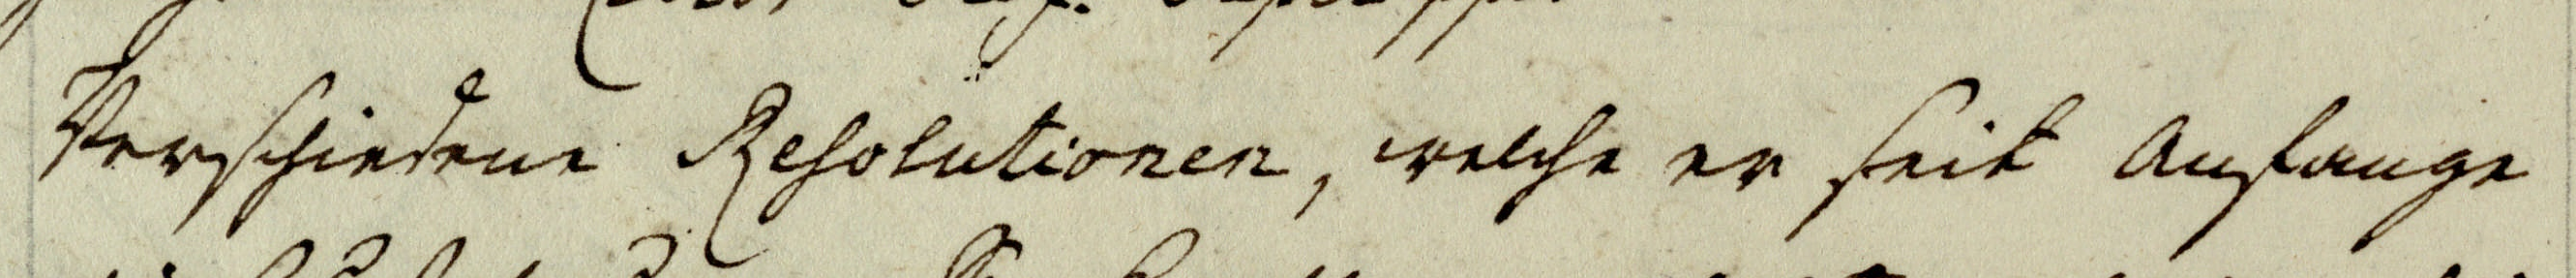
Verschiedene Resolutionen, welche er seit Anfange
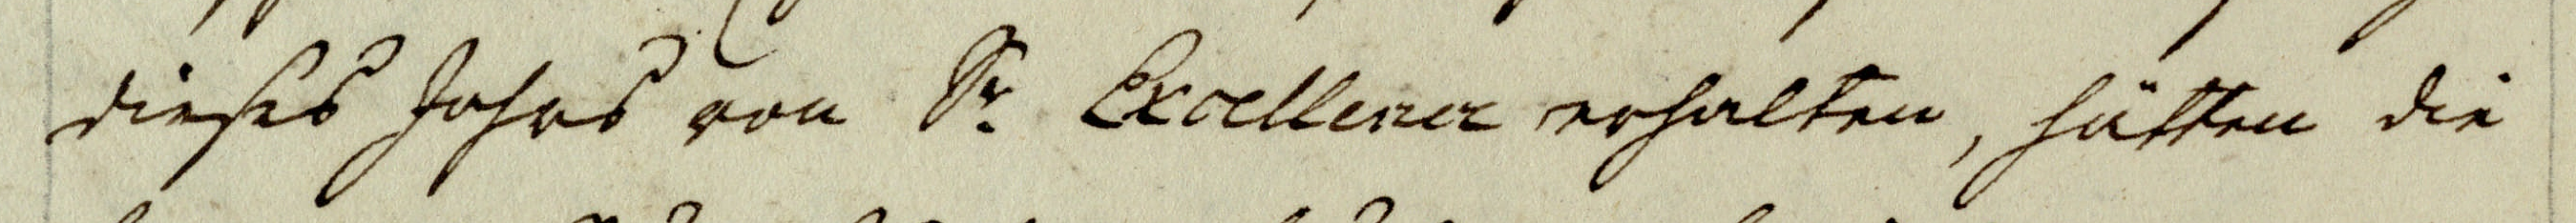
dieses Jahre von Sr. Excellence erhalten, hätten die
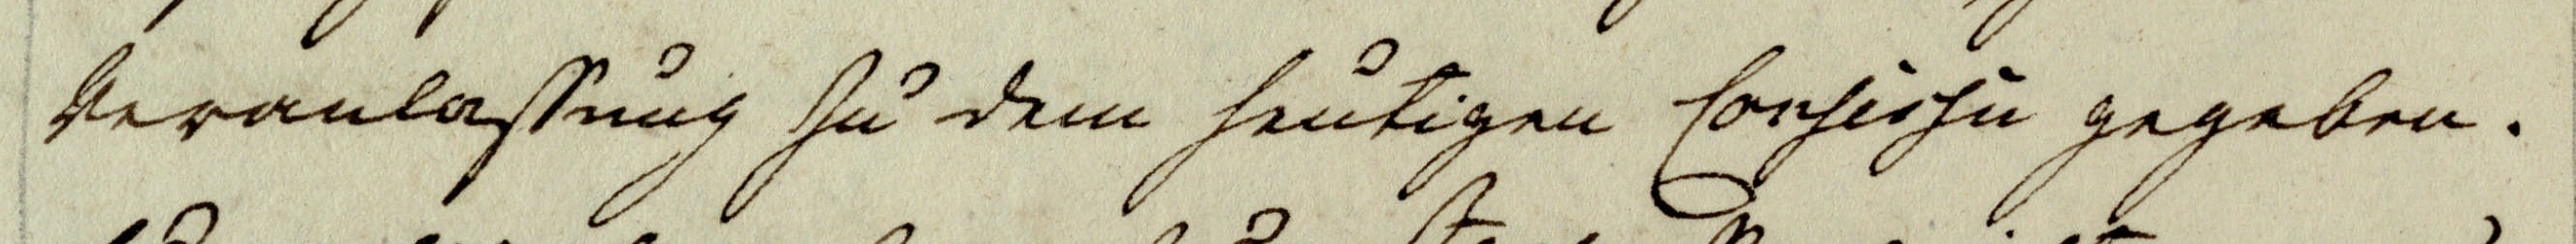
Veranlassung zu dem heutigen Consessu gegeben.
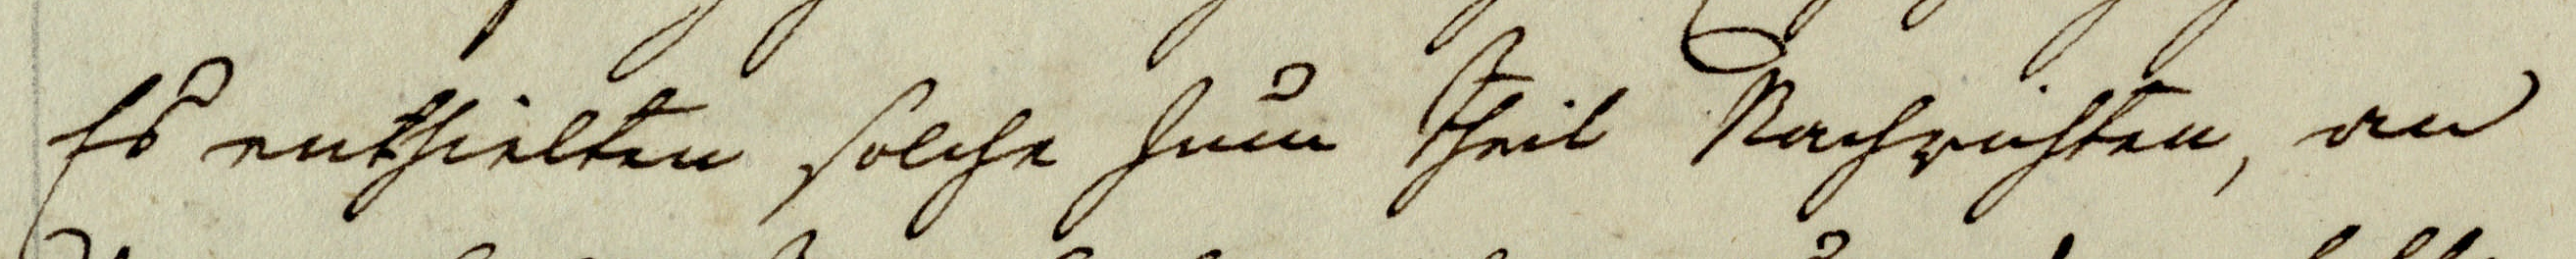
Es enthielten solche zum Theil Nachrichten, an
